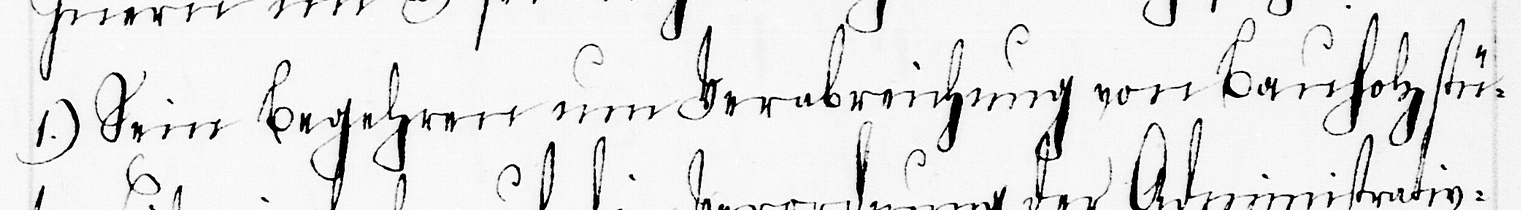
1.) Sein Begehren um Verabreichung von Bauholz stü¬
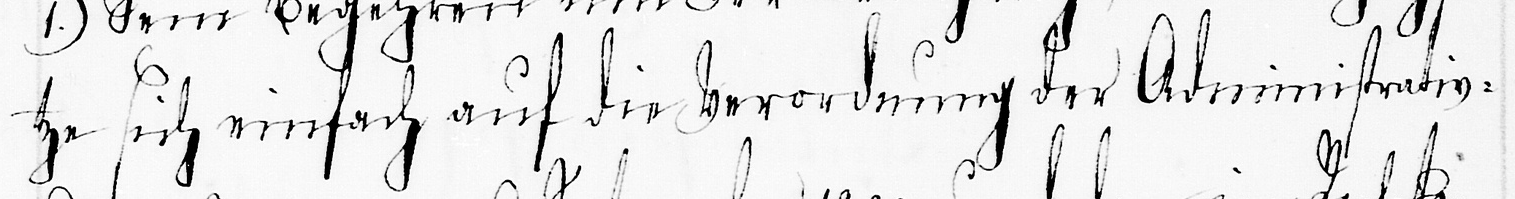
tze sich einfach auf die Verordnung der Administrati¬
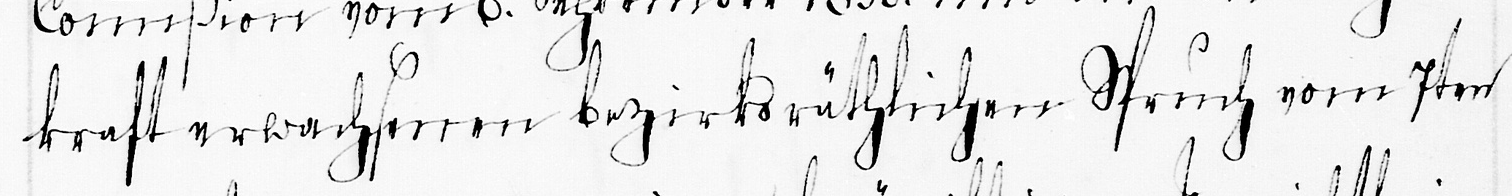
kraft erwachsenen bezirksräthlichen Spruch vom 7ten
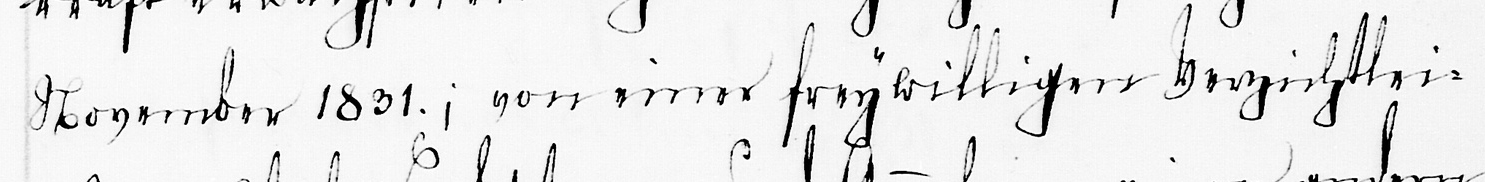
November 1831.; von einer freywilligen Verzichtlei¬
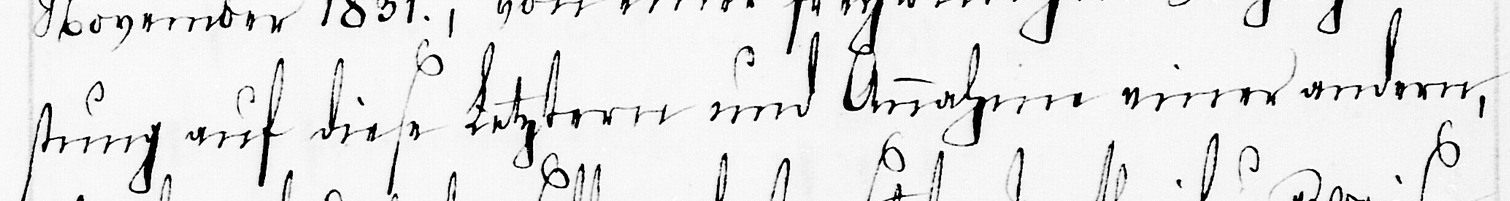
stung auf diese Letztern und Annahme einer andern,
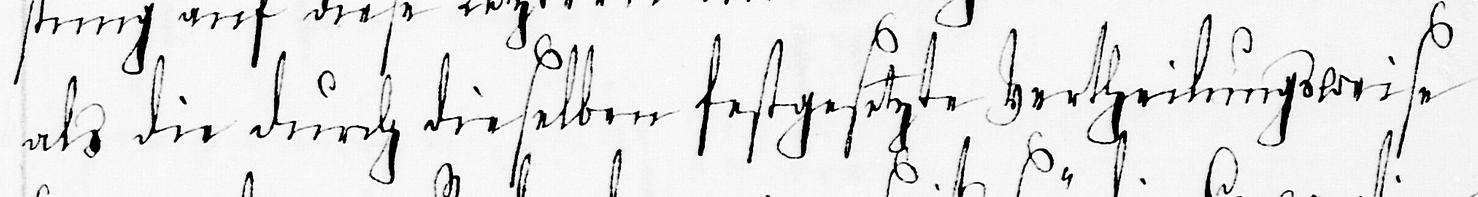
als die durch dieselben festgesetzte Vertheilungsweise
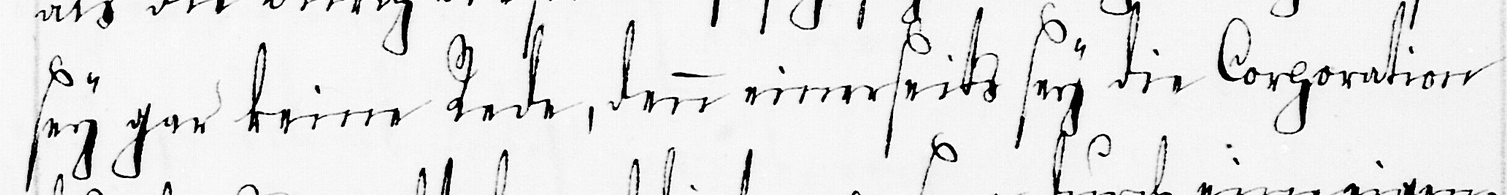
sey gar keine Rede, denn einerseits sey die Corporation
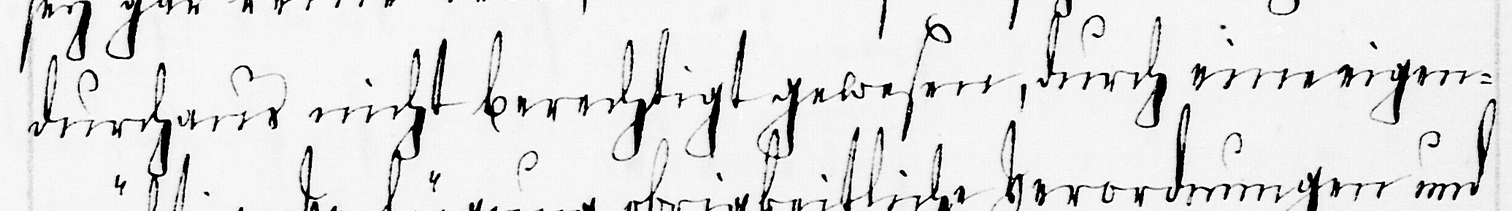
durchaus nicht berechtigt gewesen, durch eine eigen¬
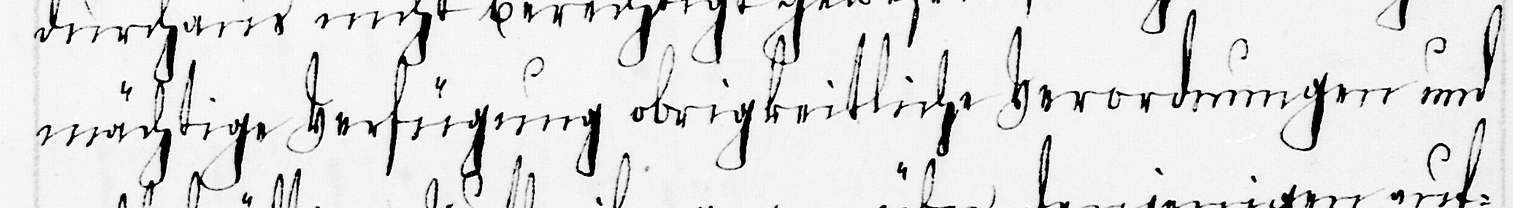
mächtige Verfügung obrigkeitliche Verordnungen und
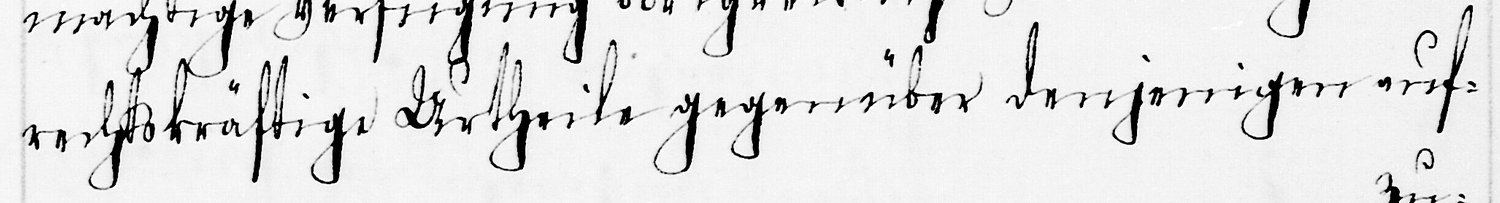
rechtskräftige Urtheile gegenüber denjenigen auf-
